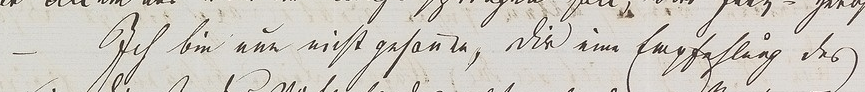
– Ich bin nun nicht gesonnen, Dir eine Empfehlung des
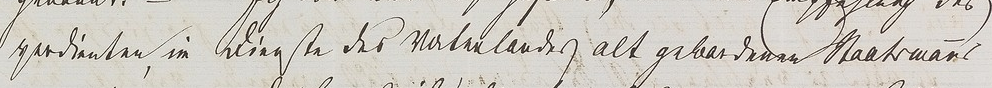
verdienten, im Dienste des Vaterlandes alt gewordenen Staatsmanns
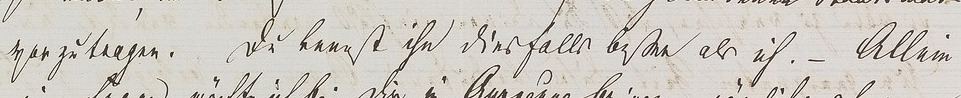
vorzutragen. Du kennst ihn diesfalls besser als ich. – Allein
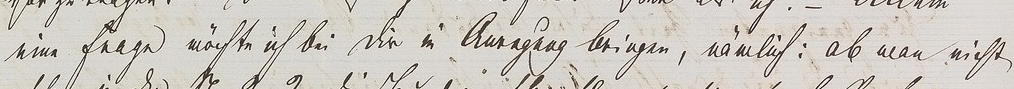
eine Frage möchte ich bei Dir in Anregung bringen, nämlich: ob man nicht
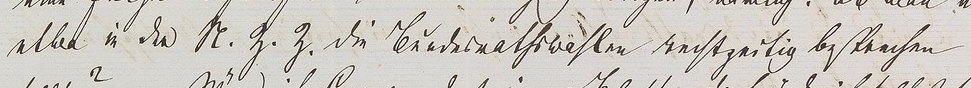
etwa in der N.Z.Z. die Bundesrathswahlen rechtzeitig besprechen
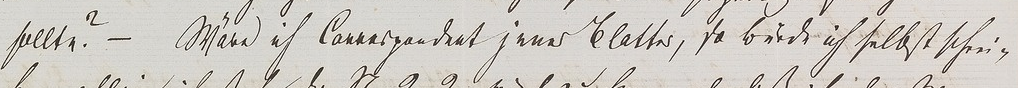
sollte? – Wäre ich Correspondent jenes Blattes, so würde ich selbst schrei-
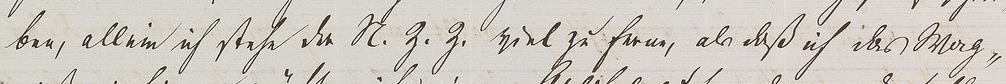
ben, allein ich stehe der N.Z.Z. viel zu ferne, als daß ich das Wag-
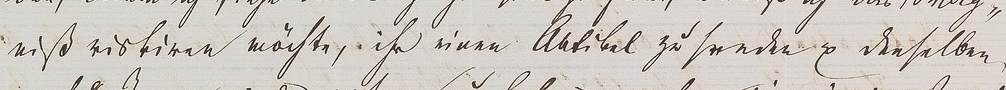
niß riskiren möchte, ihr einen Artikel zu senden & denselben
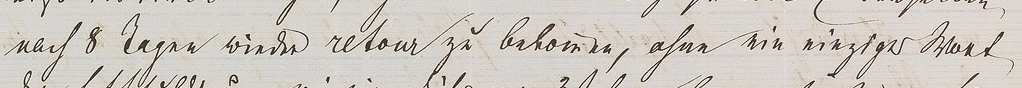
nach 8 Tagen wieder retour zu bekommen, ohne ein einziges Wort
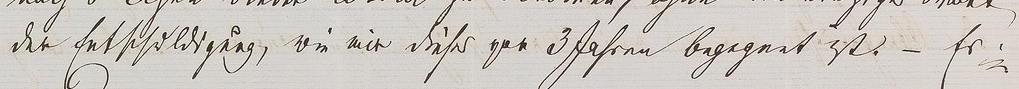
der Entschuldigung, wie mir dieses vor 3 Jahren begegnet ist. – Es
